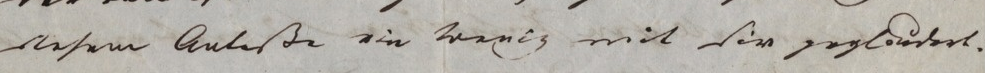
diesem Anlaße ein wenig mit Dir geplaudert.
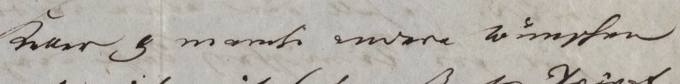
Keller & manche andere wünschen
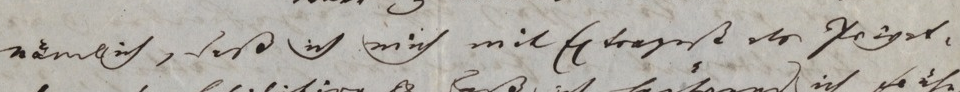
nämlich, daß ich mich mit Extrapost als Privat-
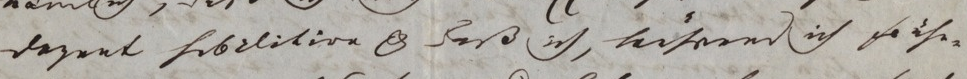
dozent habilitire & daß ich, während ich frühe-
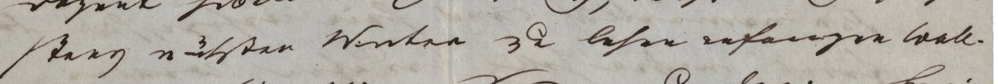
stens nächsten Winter zu lesen anfangen woll-
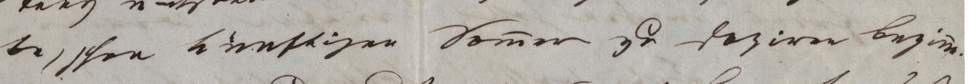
te, schon künftigen Sommer zu doziren beginne.
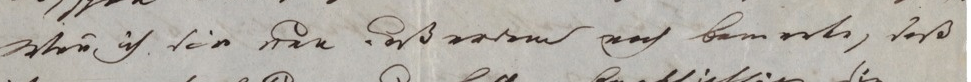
Wenn ich Dir nun außerdem noch bemerke, daß
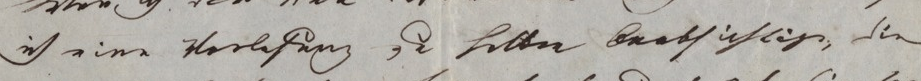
ich eine Vorlesung zu halten beabsichtige, die
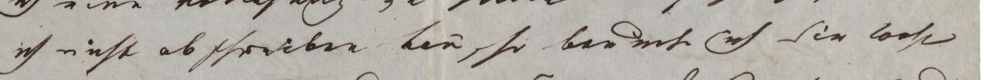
ich nicht abschreiben kann, so brauche ich Dir wohl
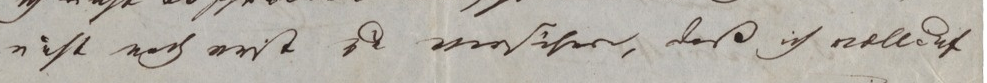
nicht noch erst zu versichern, daß ich vollauf
